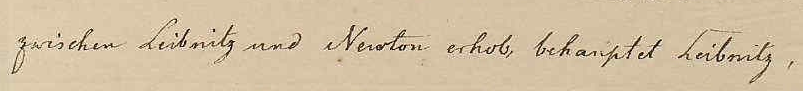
zwischen Leibnitz und Newton erhob, behauptet Leibnitz,
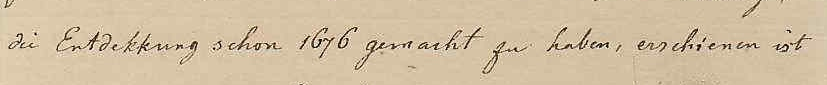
die Entdekkung schon 1676 gemacht zu haben, erschienen ist
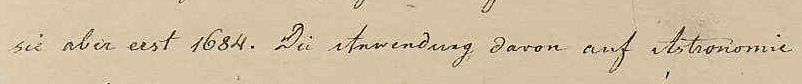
sie aber erst 1684. Die Anwendung davon auf Astronomie
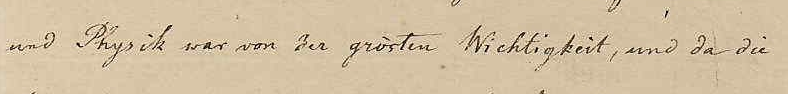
und Physik war von der grösten Wichtigkeit, und da die
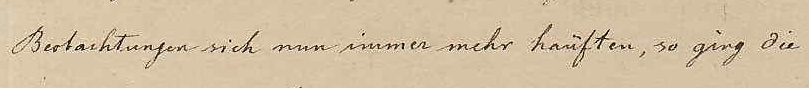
Beobachtungen sich nun immer mehr häuften, so ging die
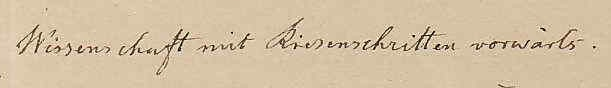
Wissenschaft mit Riesenschritten vorwärts.
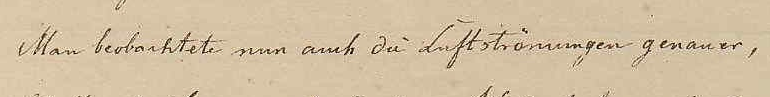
Man beobachtete nun auch die Luftströmungen genauer,
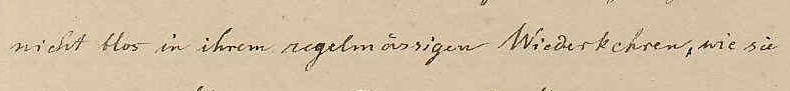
nicht blos in ihrem regelmässigen Wiederkehren, wie sie
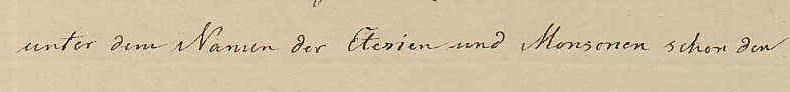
unter dem Namen der Etesien und Monsonen schon den
